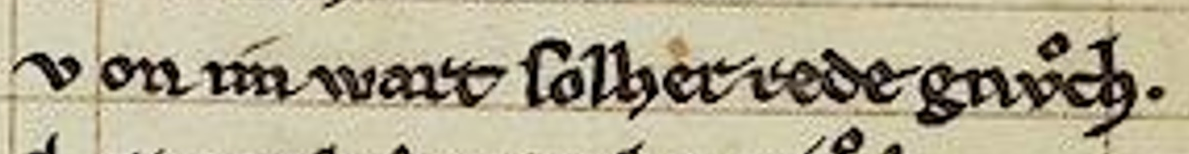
Von im wart ſolher rede gnv°och.
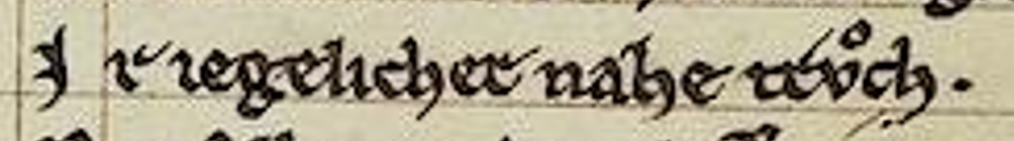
Ir iegelicher nahe trv°och.
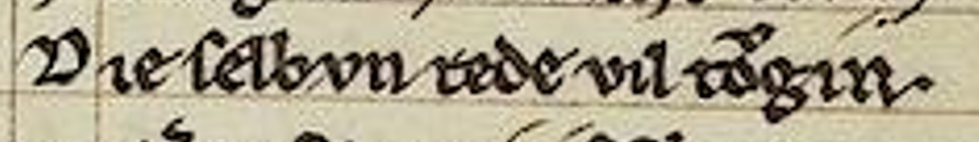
Die ſelbvn rede vil to°vgin.
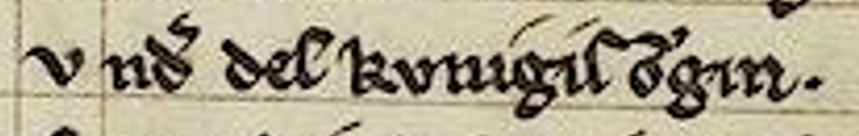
Vnd(er) deſ kvnigiſ o°vgin.
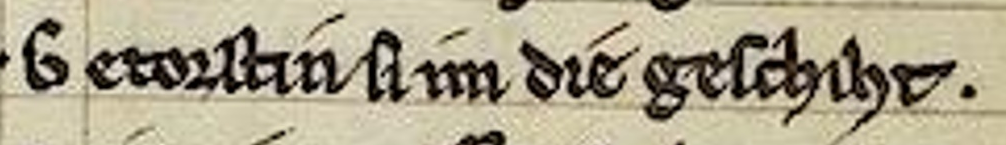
Getorſtin ſi im die geſchiht.
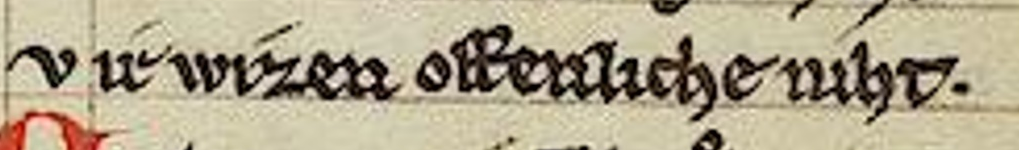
Vir wizen offenliche niht.
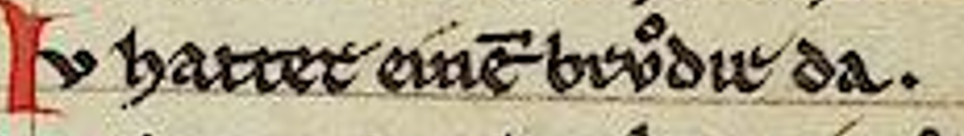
*Nv hatter eine(n) brv°odir da.
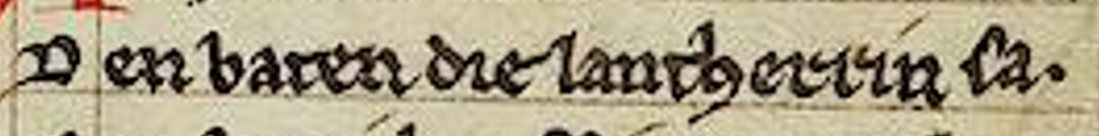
Den baten di lantherrin ſa.
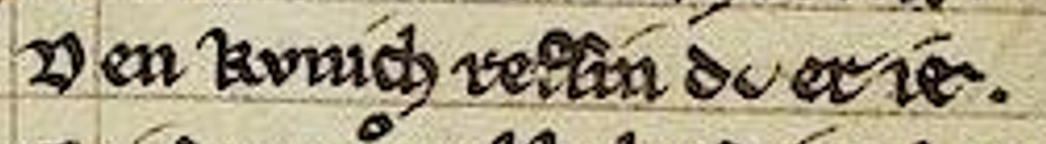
Den kvnich refſin d(az) er ie.
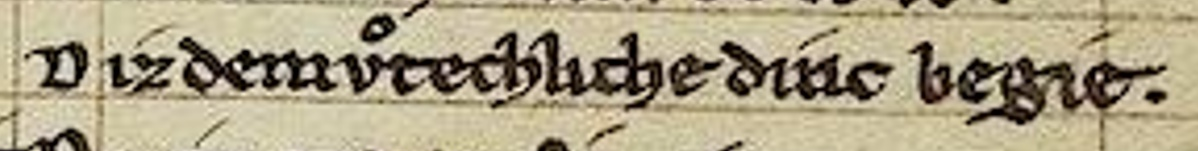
Diz dem v°otechliche dinc begie.
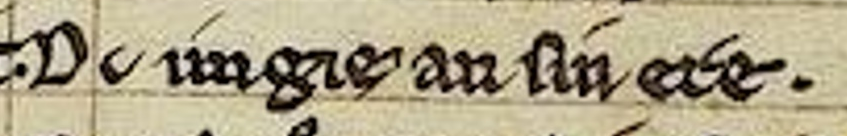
D(az) im gie an ſin ere.
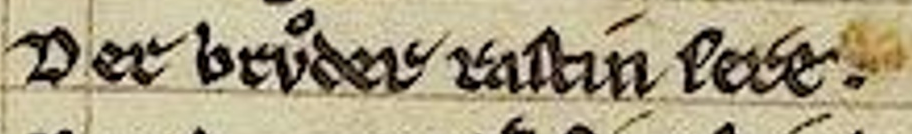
Der brv°oder raſtin ſere.
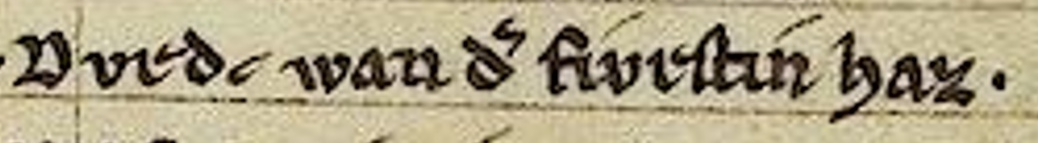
Dvr d(az) wan d(er) fivrſtin haz.
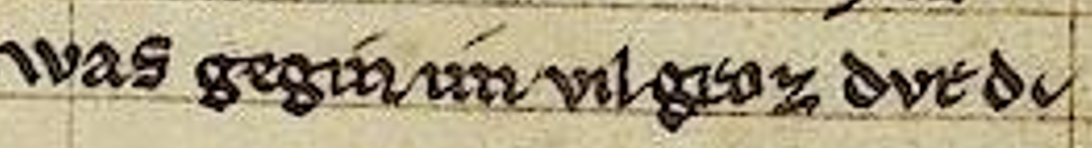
Was gegin im vil groz dvr d(az)
